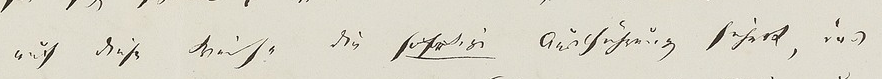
auf diese Weise die sofortige Ausführung sichert, das
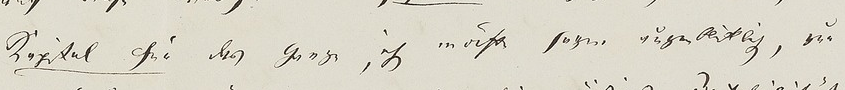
Kapital für das Ganze, ich möchte sagen augenblicklich, zur
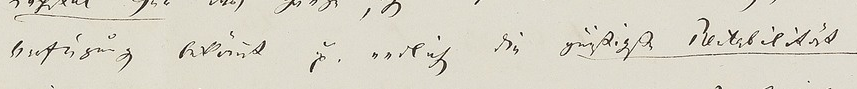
Verfügung bekömmt &. endlich die günstigste Rentabilität
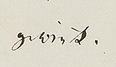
gewinnt.
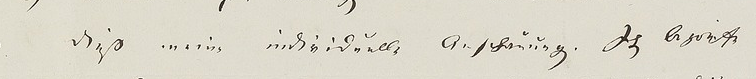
Dieß meine individuelle Anschauung. Ich begreife
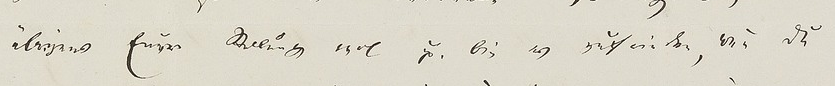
übrigens Euere Stellung wol &. bin es zufrieden, wenn Du
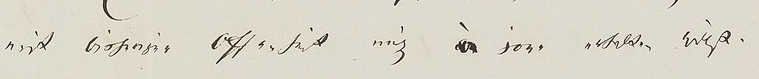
mit bisheriger Offenheit mich à jour erhalten willst.
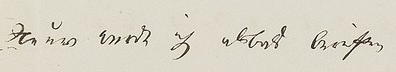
Neues werde ich alsbald berichten.
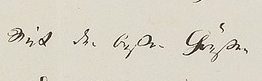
Mit den besten Grüßen
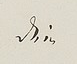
Dein
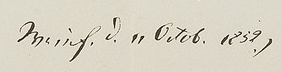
Weinf. d. 11 Octob. 1852.
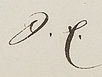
I. E.
